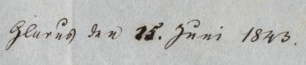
Glarus den 15. Juni 1843.
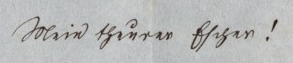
Mein theurer Escher!
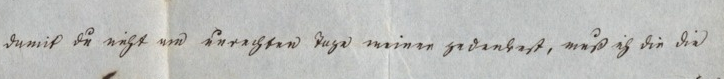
Damit du nicht am unrechten Tage meiner gedenkest, muß ich dir die
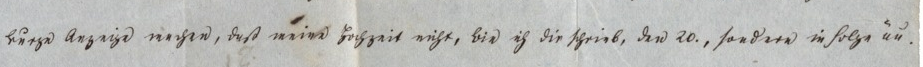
kurze Anzeige machen, daß meine Hochzeit nicht, wie ich dir schrieb, den 20., sondern in Folge äu-
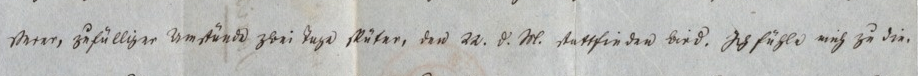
ßerer, zufälliger Umstände zwei Tage später, den 22. d. M. stattfinden wird. Ich fühle mich zu die-
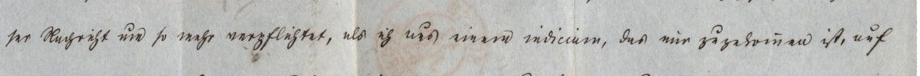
ser Nachricht um so mehr verpflichtet, als ich aus einem indicium, das mir zugekommen ist, auf
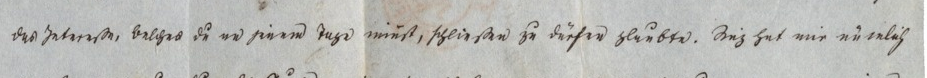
das Interesse, welches du an jenem Tage nimmst, schließen zu dürfen glaubte. Sinz hat mir nämlich
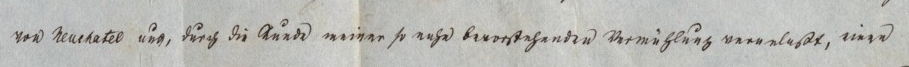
von Neuchatel aus, durch die Kunde meiner so nahe bevorstehenden Vermählung veranlaßt, einen
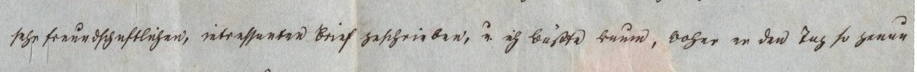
sehr freundschaftlichen, intressanten Brief geschrieben, u. ich wüßte kaum, woher er den Tag so genau
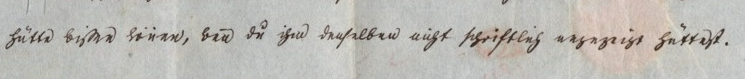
hätte wissen können, wenn du ihm denselben nicht schriftlich angezeigt hättest.
